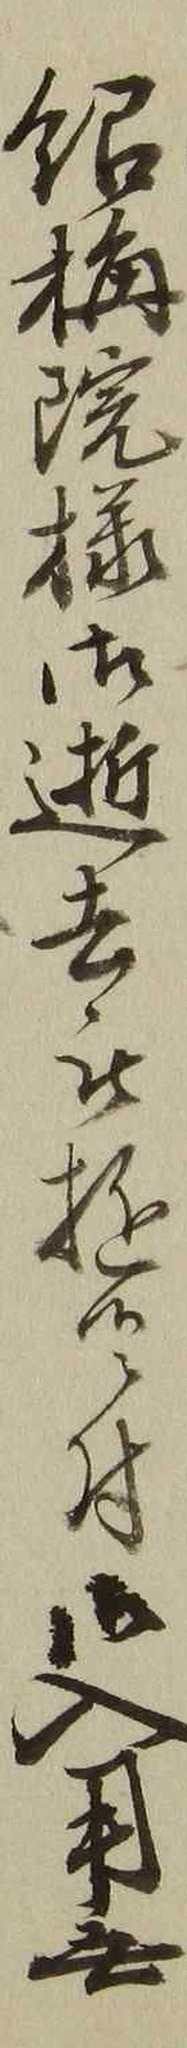紹栴院様御遊去被遊候ニ付御入用無
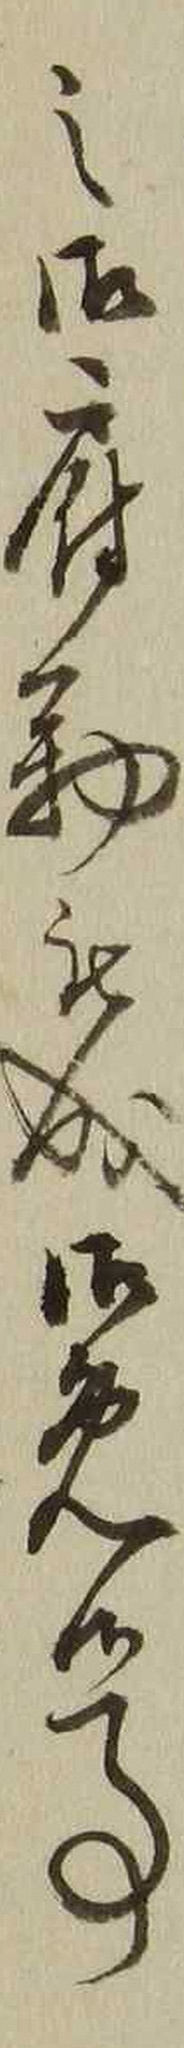之御府勤被成御免候事
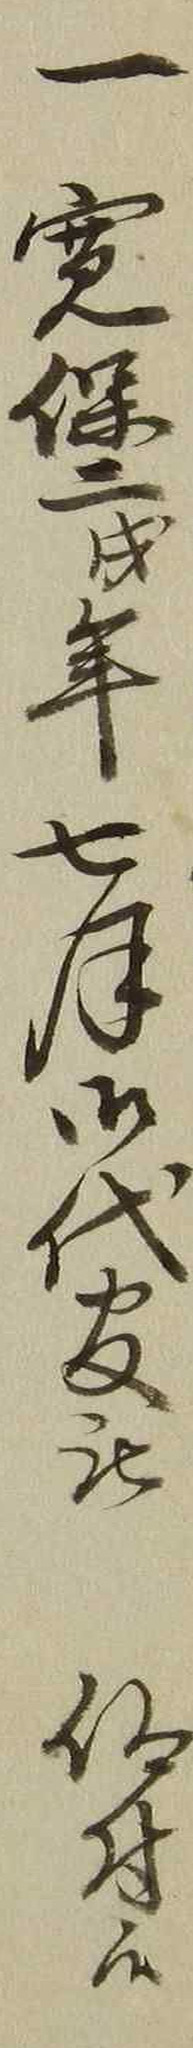一寛保二戌年七月御代官被仰付候
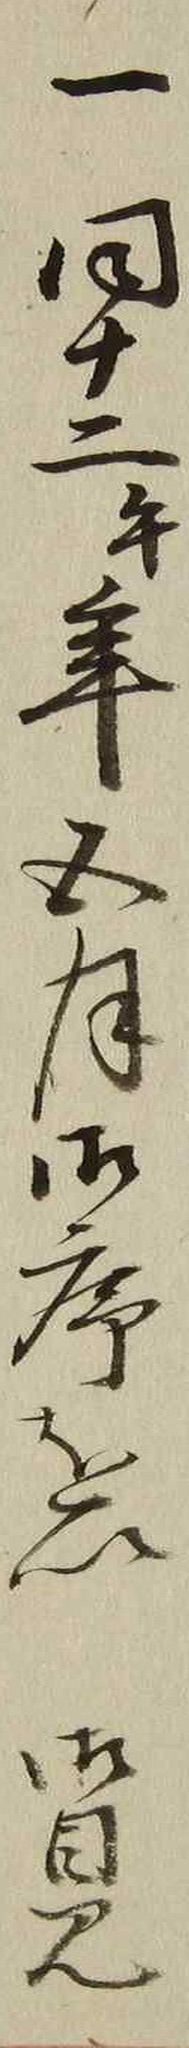一同十二午年五月御序を以御目見
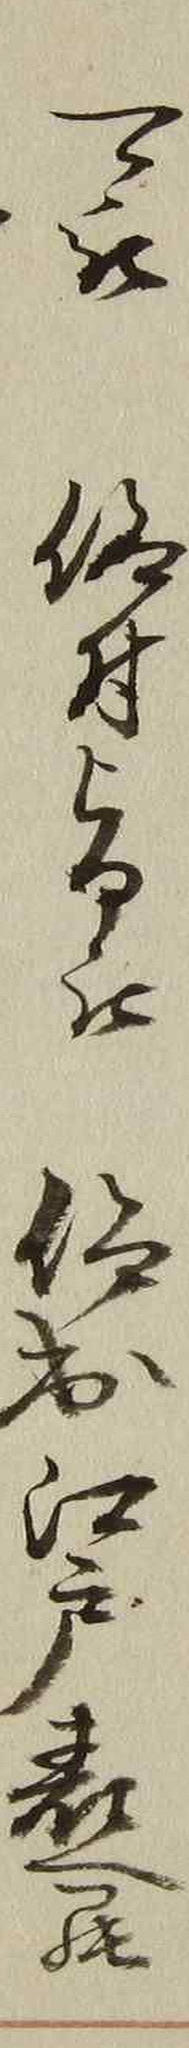可被仰付旨被仰出江戸表へ罷
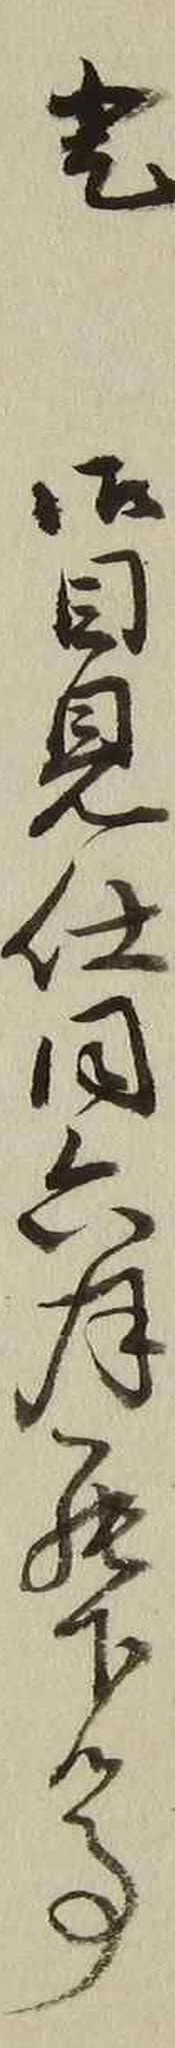登御目見仕同六月罷下候事
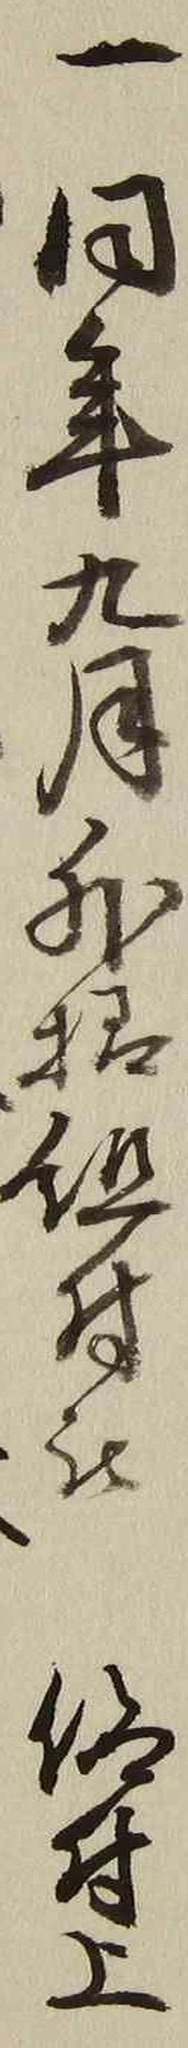一同年九月外様組付被仰付上
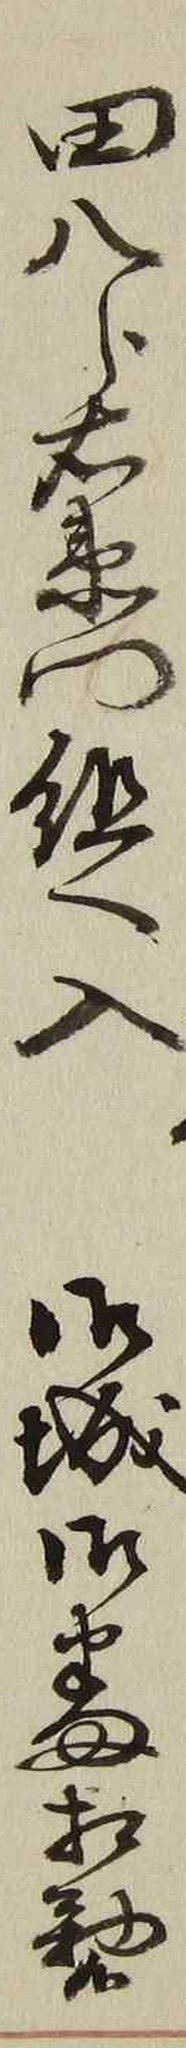田八郎右衛門組へ入御城御番相勤候
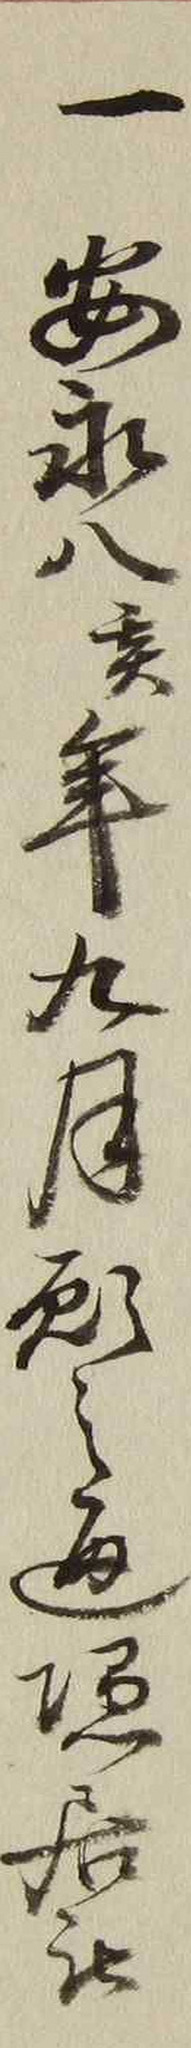一安永八亥年九月願之通隠居被
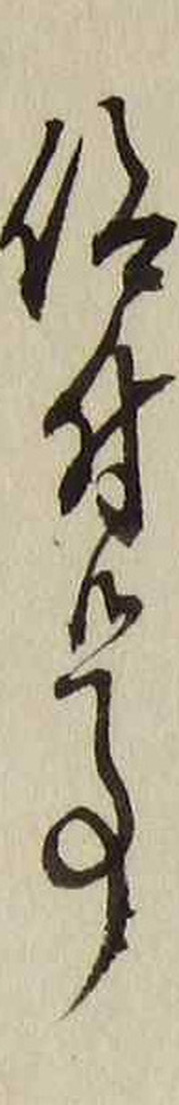仰付候事
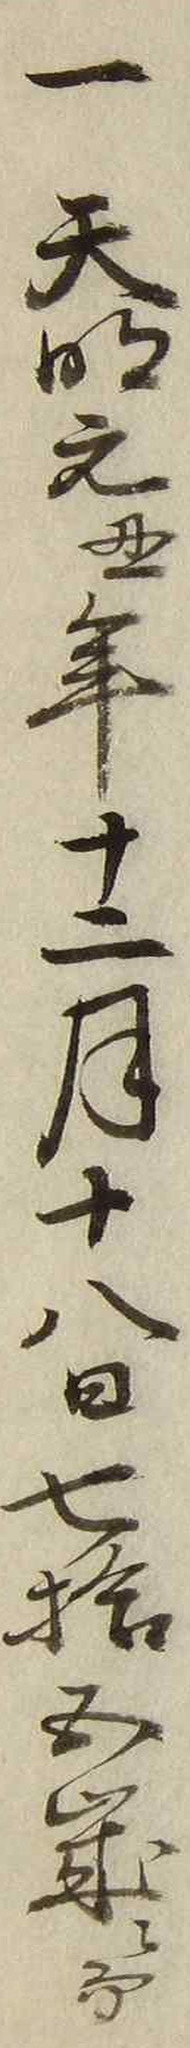一天明元丑年十二月十八日七拾五歳ニ而

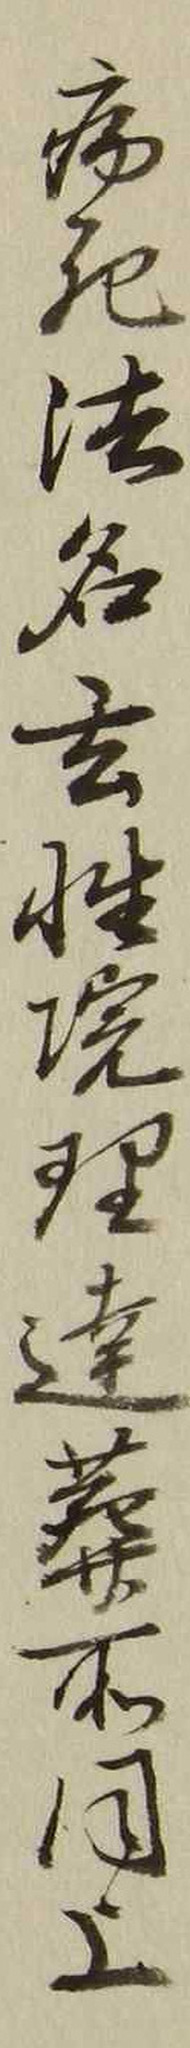病死法名玄性院理達葬所同上
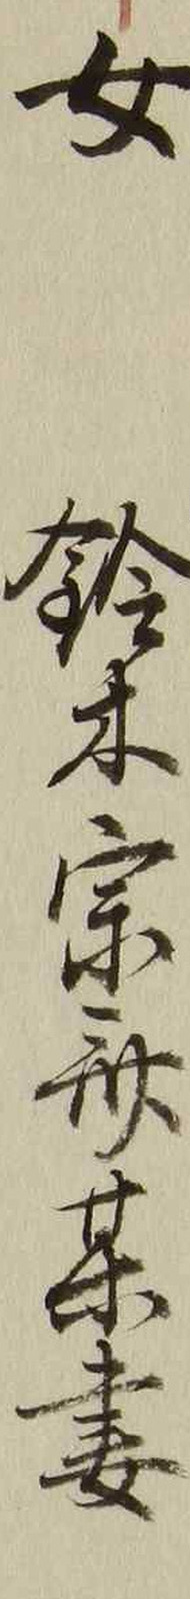女鈴木宗斎某妻
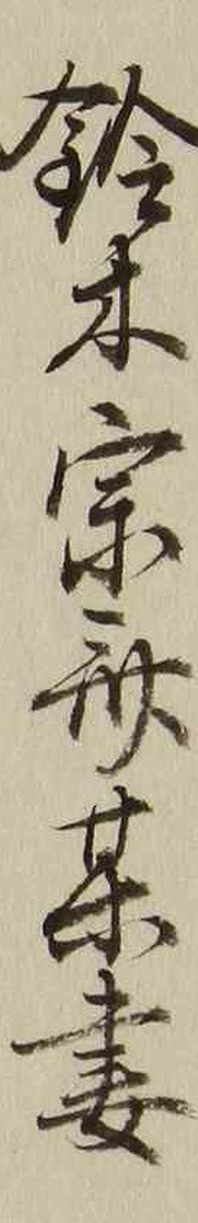女鈴木宗斎某妻
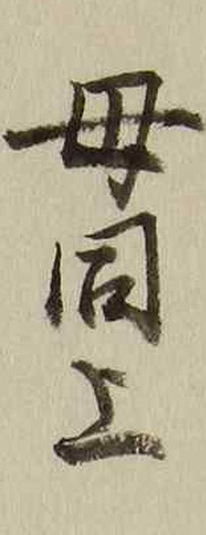母同上
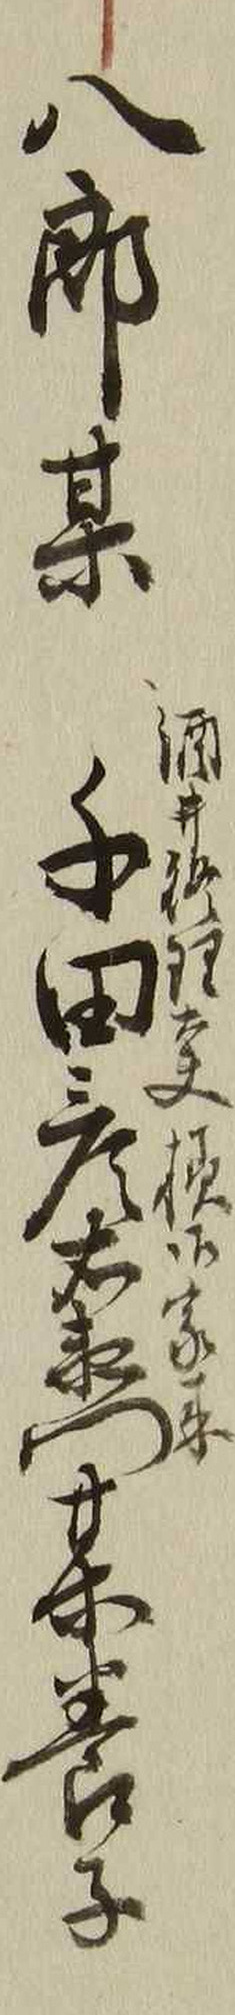八郎某千田彦右衛門某養子
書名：諸士系譜　巻之35　は之部3
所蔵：会津若松市立会津図書館
